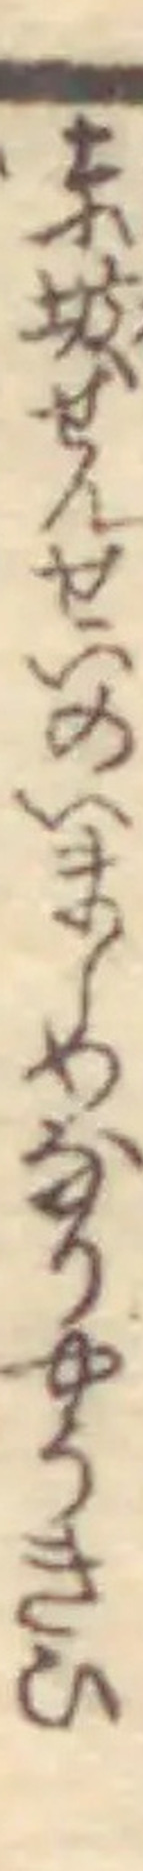東坡せんせいのいましめなりやうきひ
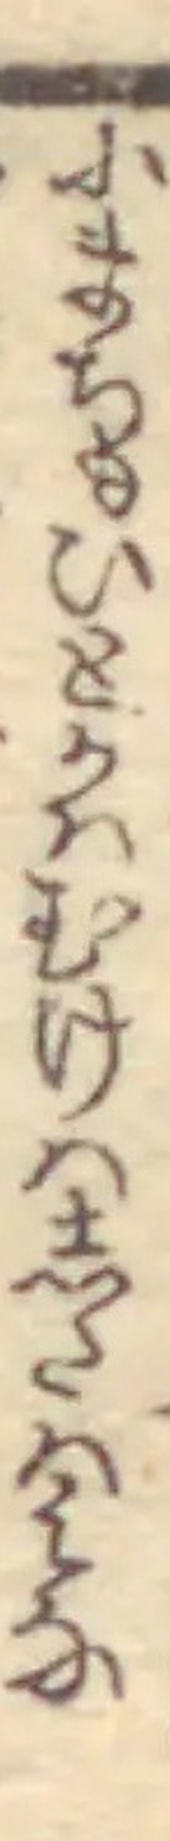小まちもひとかはむけはしたははな
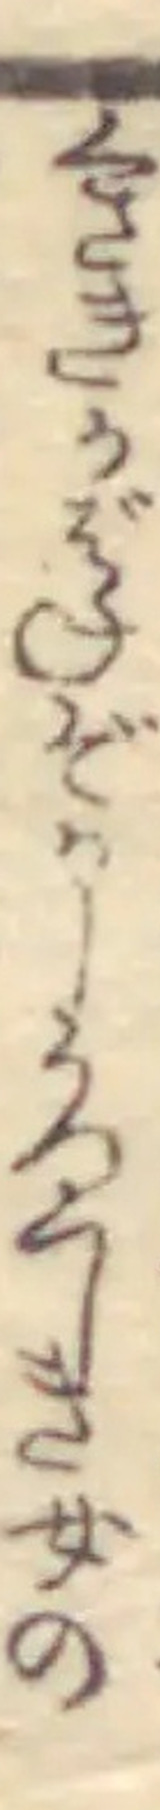くさきかばねぞかしうつくしき女の
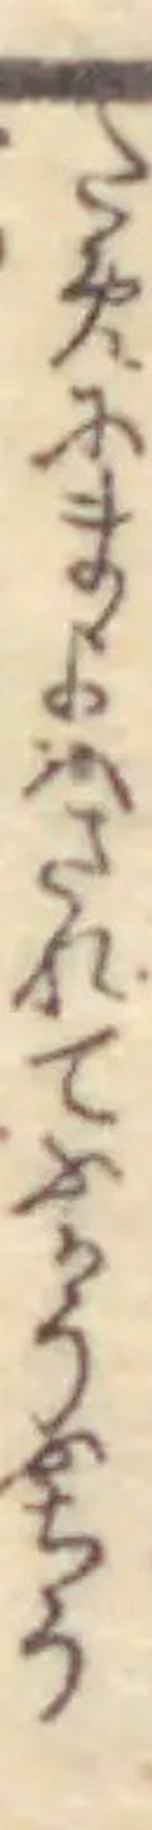ためにまよはされてふかうふちう
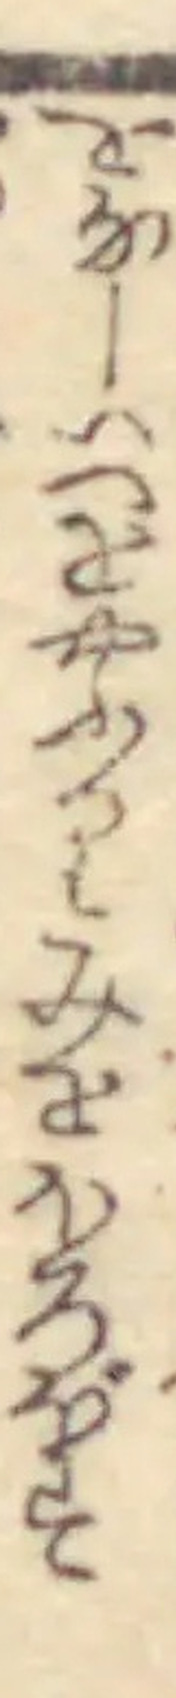をなしいへをやふりみをほろぼす
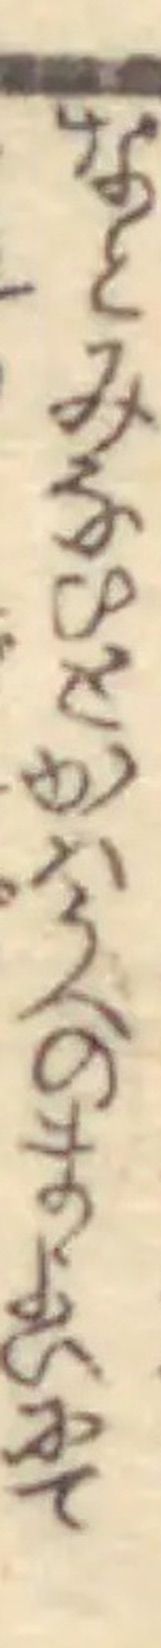なとみなひとかはうへのまよいにて
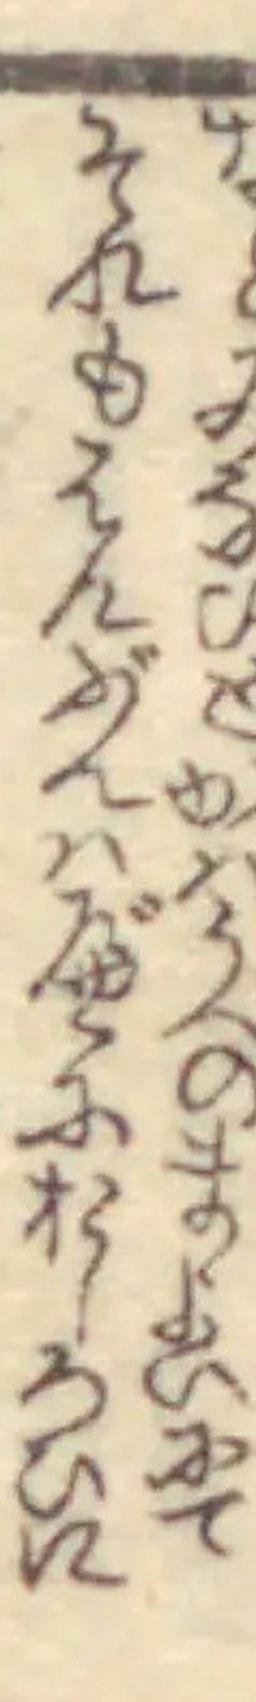それもはんぶんはべにおしろひに
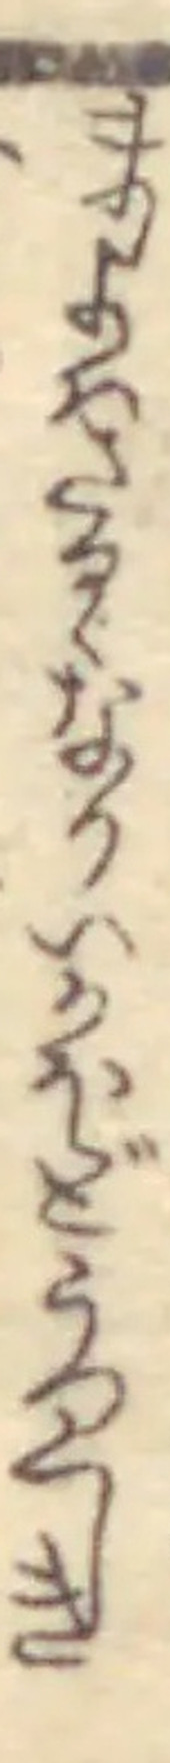まよはさるゝなりいかほどうつくしき
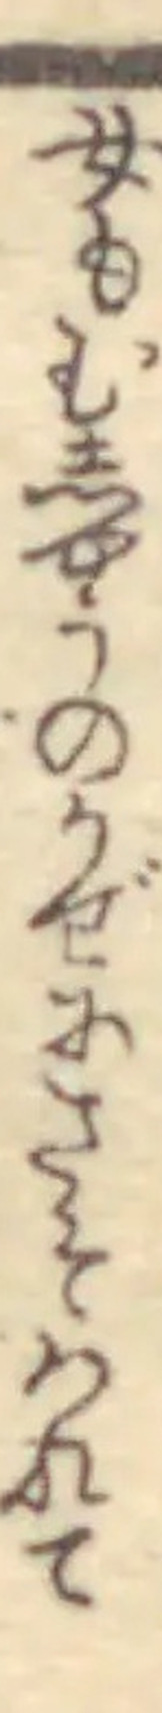女もむしやうのかぜにさそはれて
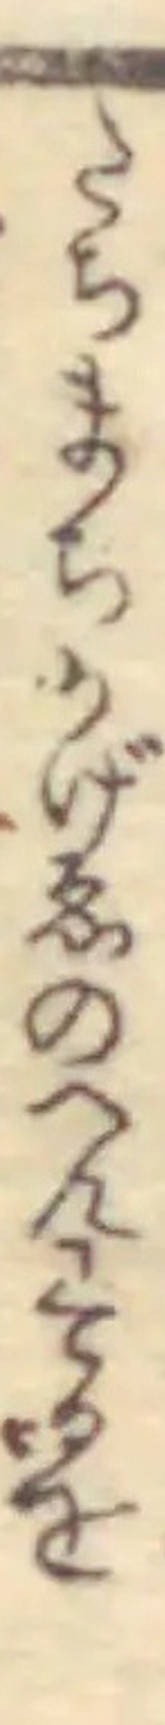たちまちかげゑのへんするを
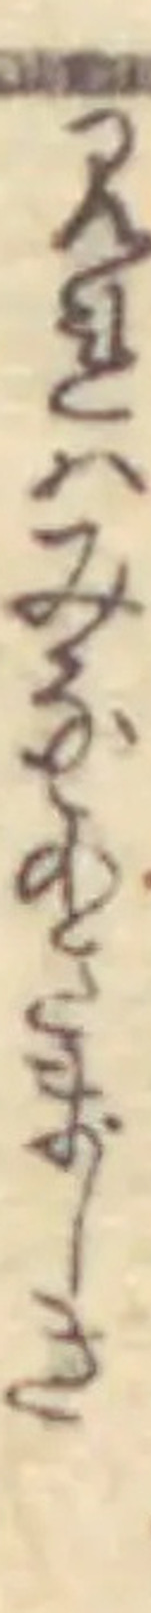見れはみなあさましき
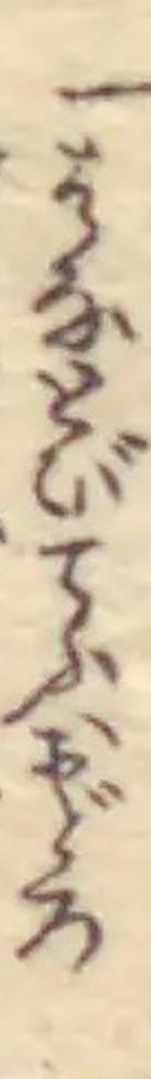乁はなとびてふおどろ
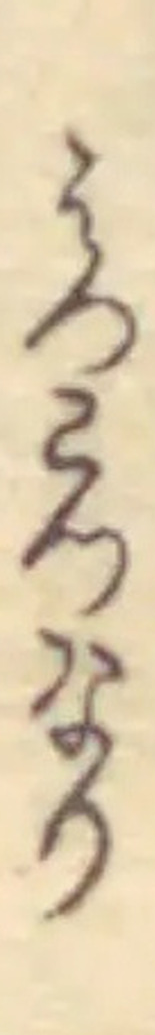はつこつなり
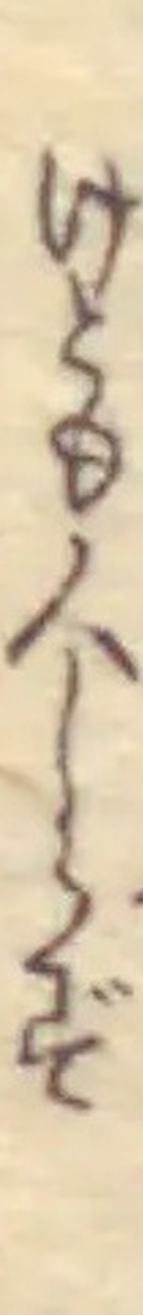けとも人しらず
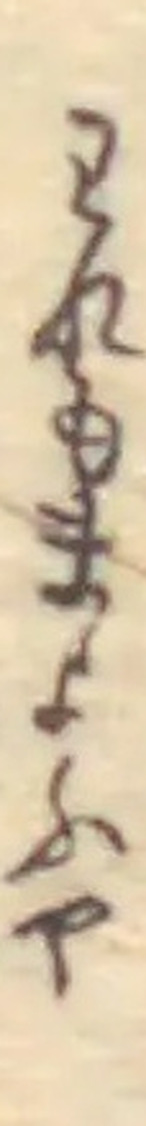われもまよふや
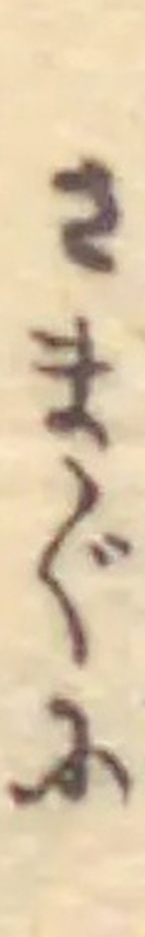さま〴〵に
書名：児訓影絵喩 3巻
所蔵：国立国会図書館 National Diet Library, JAPAN
